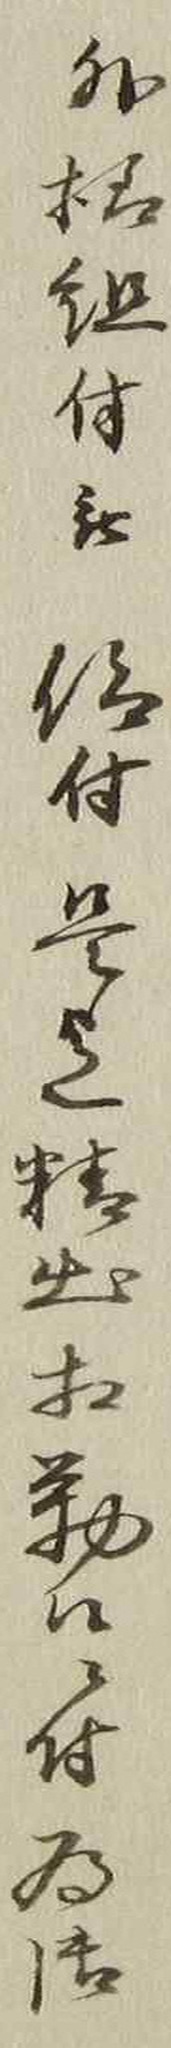外様組付被仰付是迄精出相勤候ニ付ゐ御
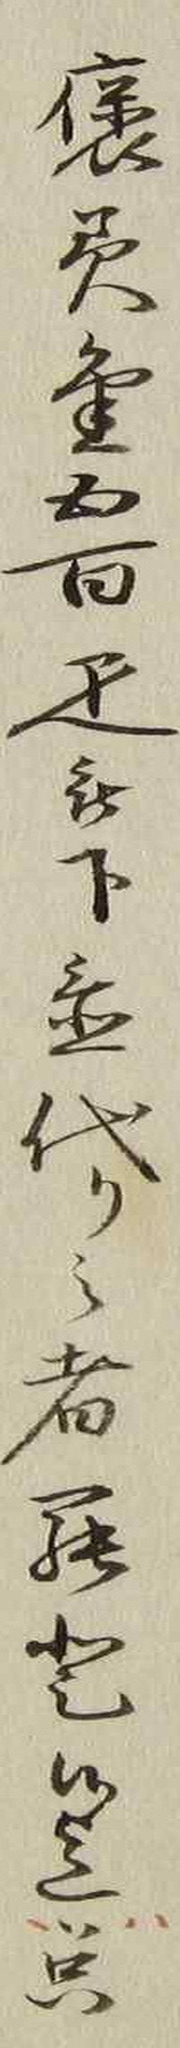褒美金五百疋被下置代リ之者罷登候迄ハ只
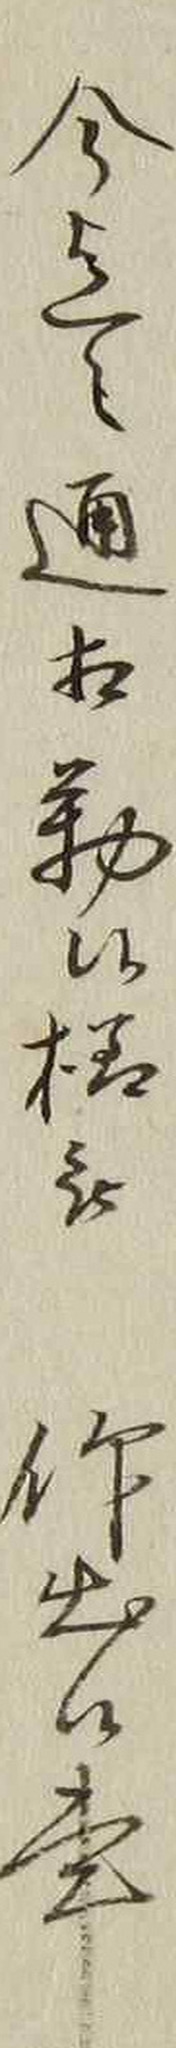今迄之通相勤候様被仰出候事
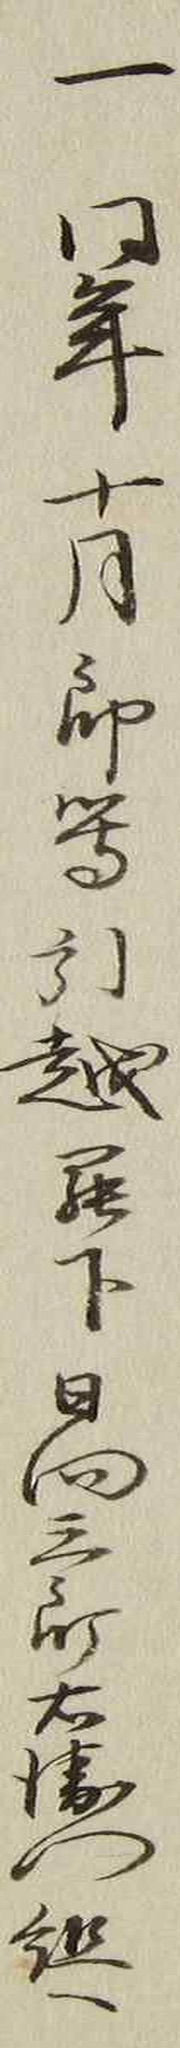一同年十月郎等引越罷下日向三郎右衛門組ヘ
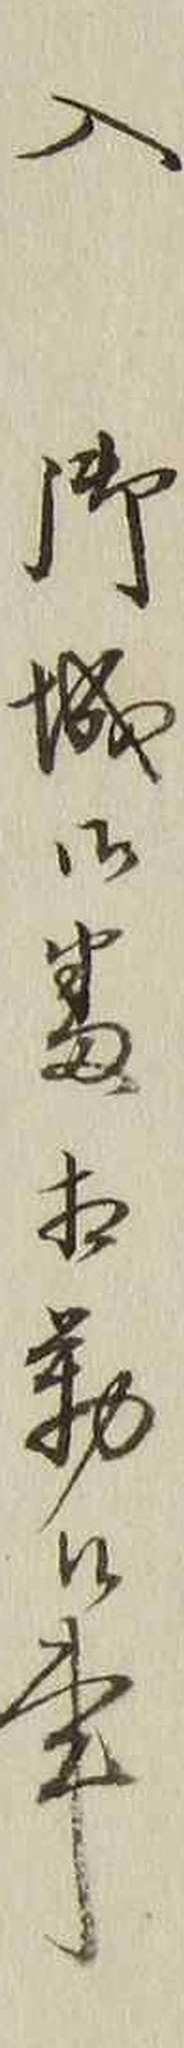入御城御番相勤候事
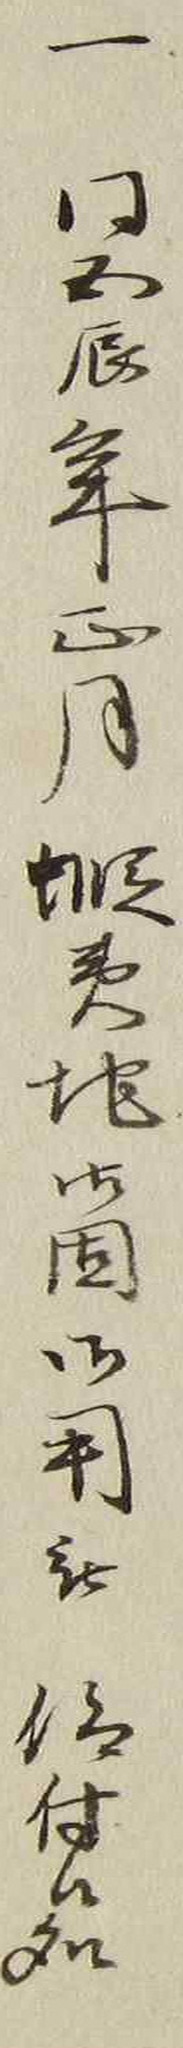一同五辰年正月蝦夷地御固御用被仰付候処
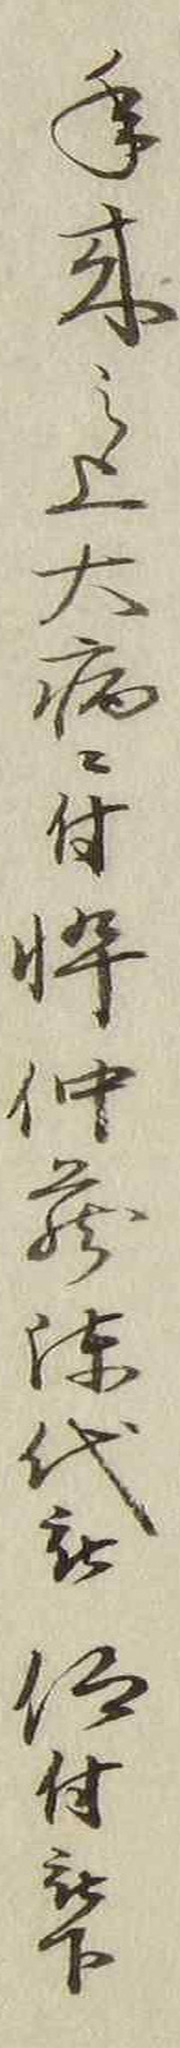年来之上大病ニ付忰仲蔵陳代被仰付被下
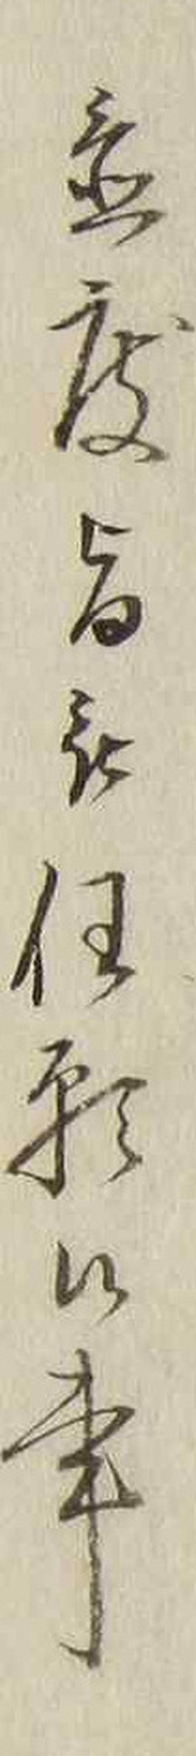置度旨被伺願候事

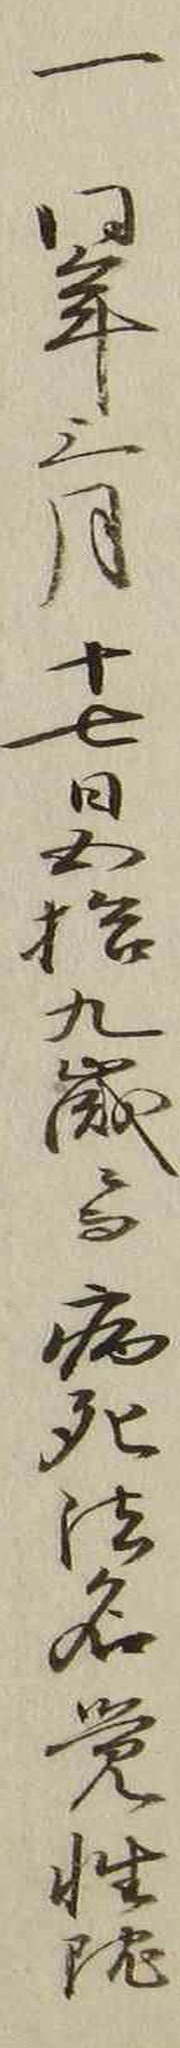一同年三月十七日五拾九歳ニ而病死法名覚性院
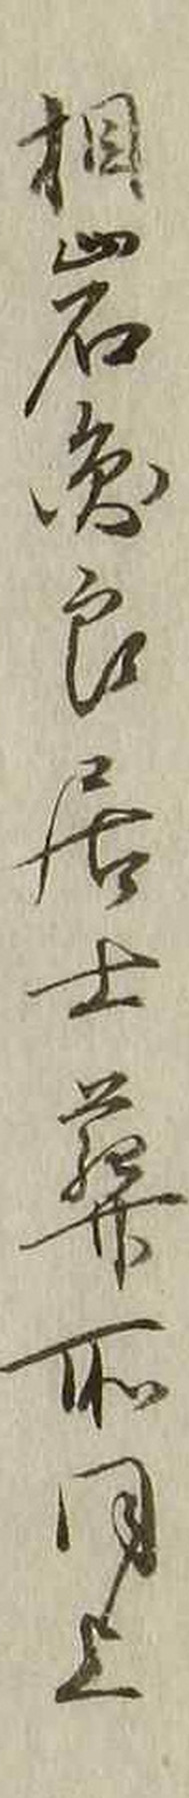桐岩円良居士葬所同上
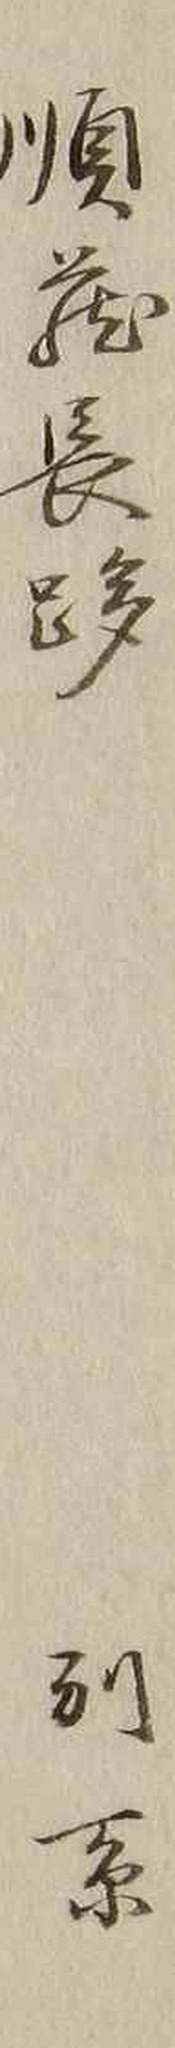順蔵長夥別系
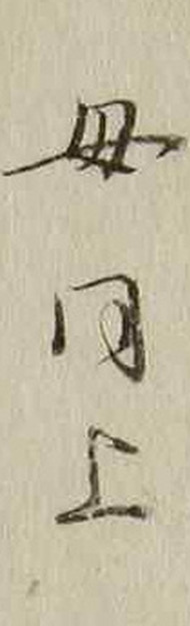母同上
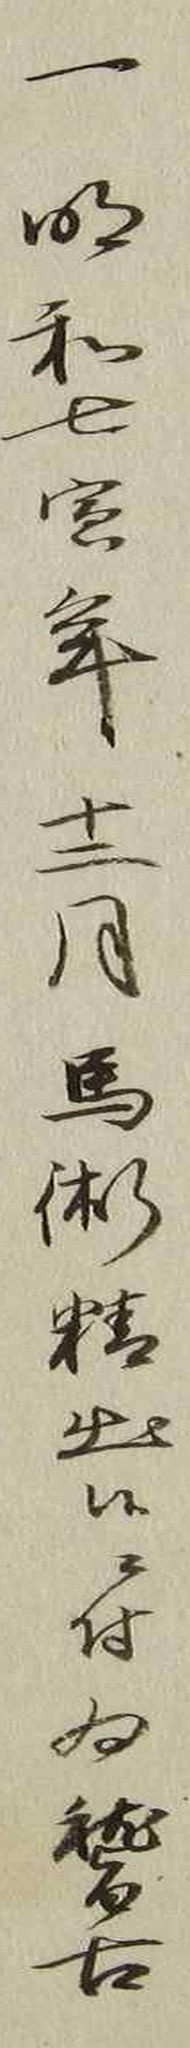一明和七寅年十二月馬術精出候ニ付ゐ稽古
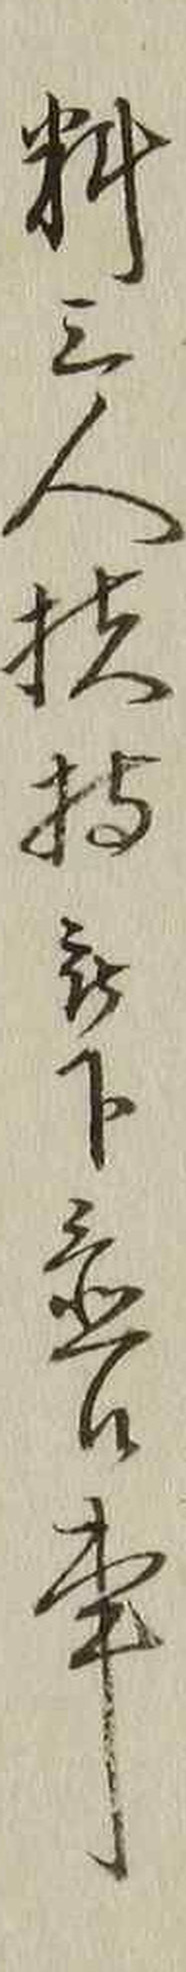料三人扶持被下置候事
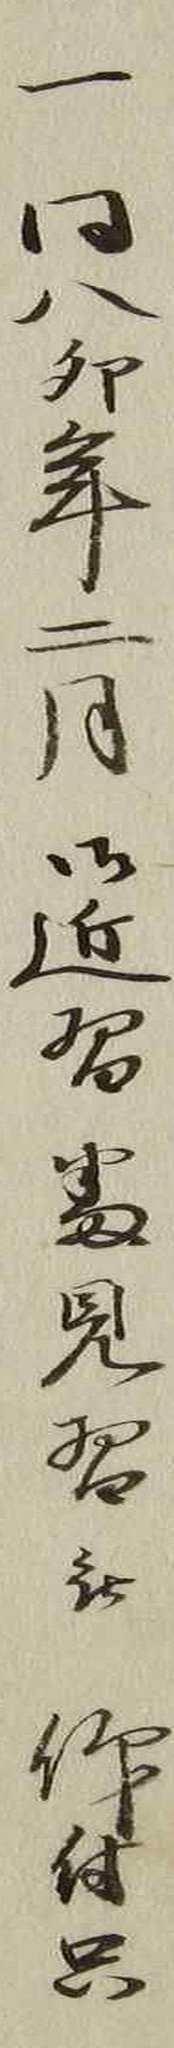一同八夘年二月御近習番見習被仰付只
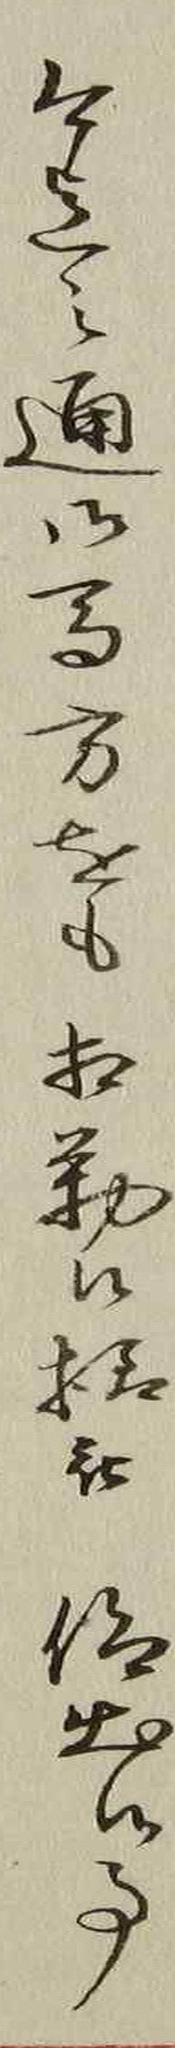今迄之通御馬方をも相勤候様被仰出候事
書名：諸士系譜　巻之114　か之部22
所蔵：会津若松市立会津図書館
